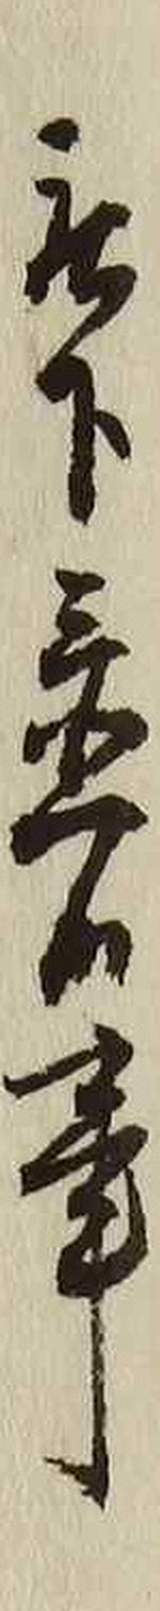被下置候事
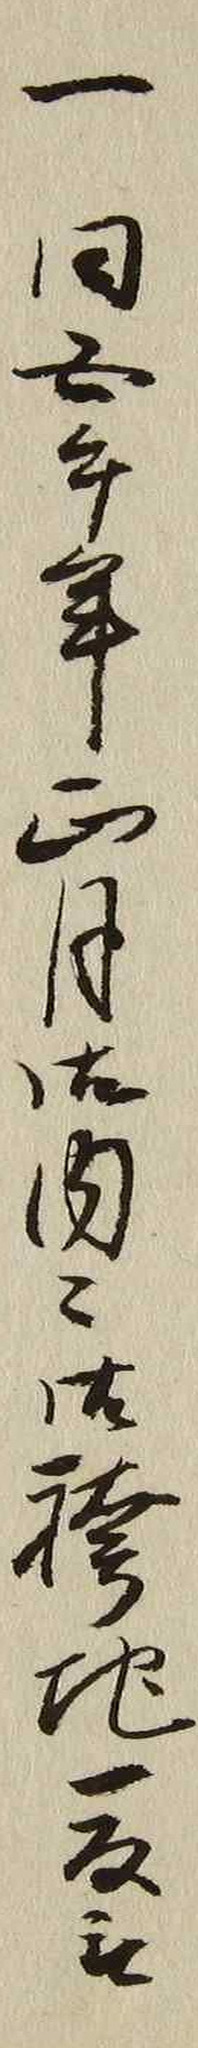一同五午年正月御内々御袴地一反被
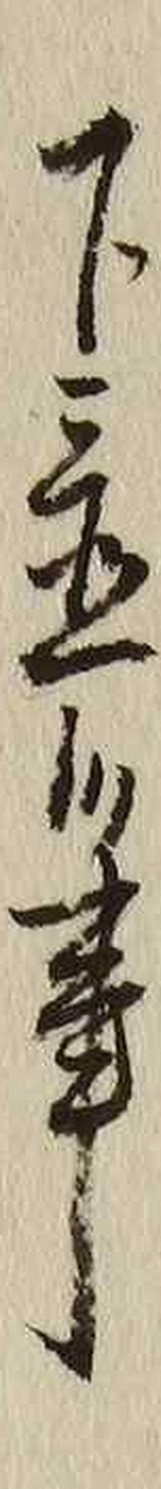下置候事
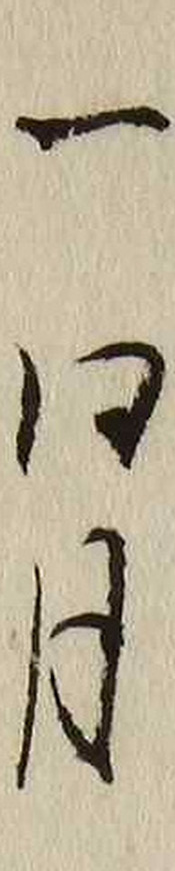一同月
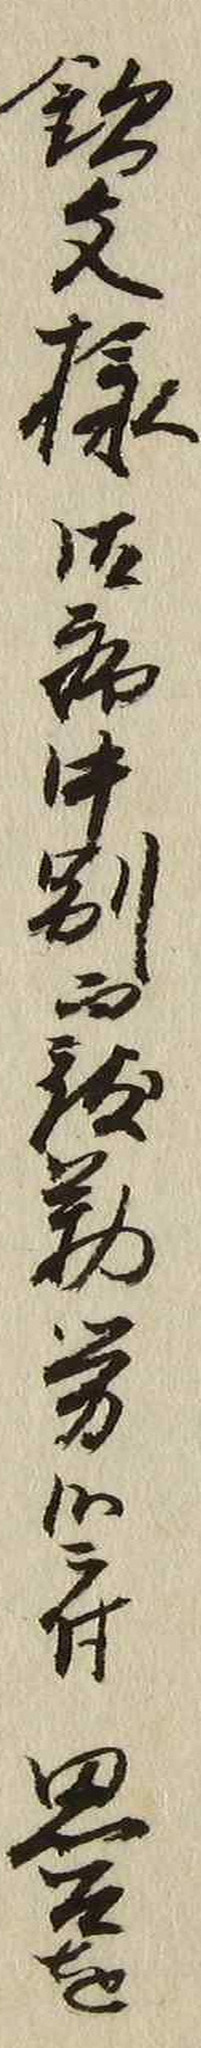欽文様御病中別而致勤労候ニ付思召を
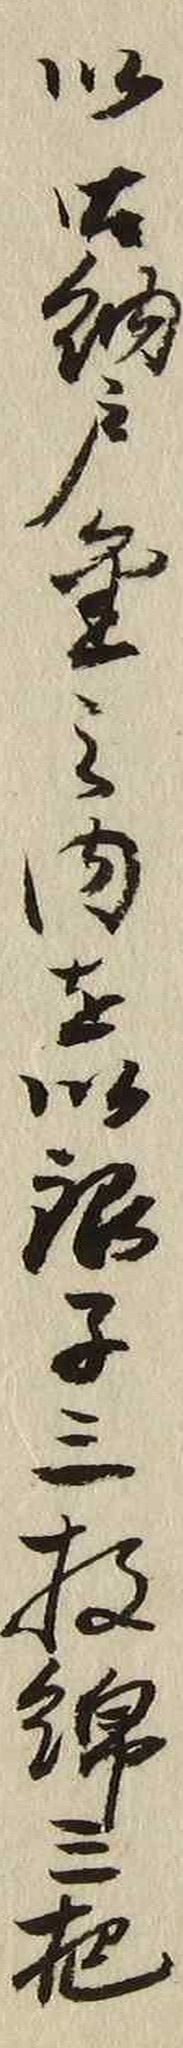以御納戸金之内を以銀子三枚綿三把
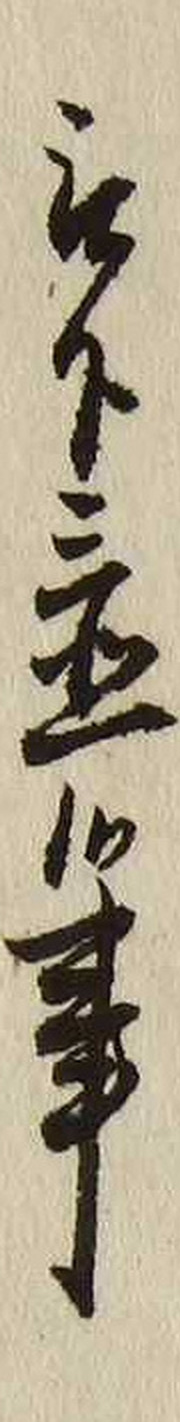被下置候事
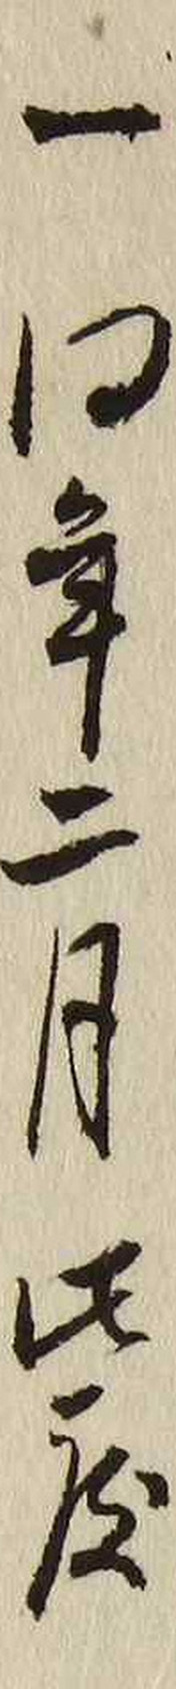一同年二月此度
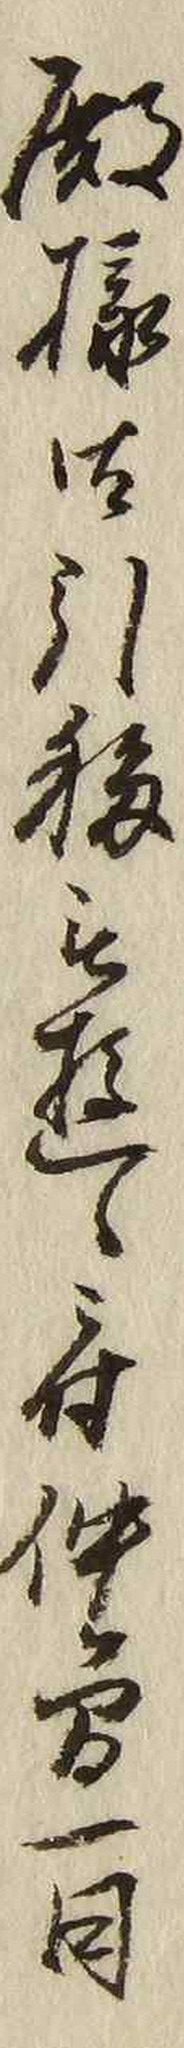殿様御引移被遊候ニ付仲ケ間一同
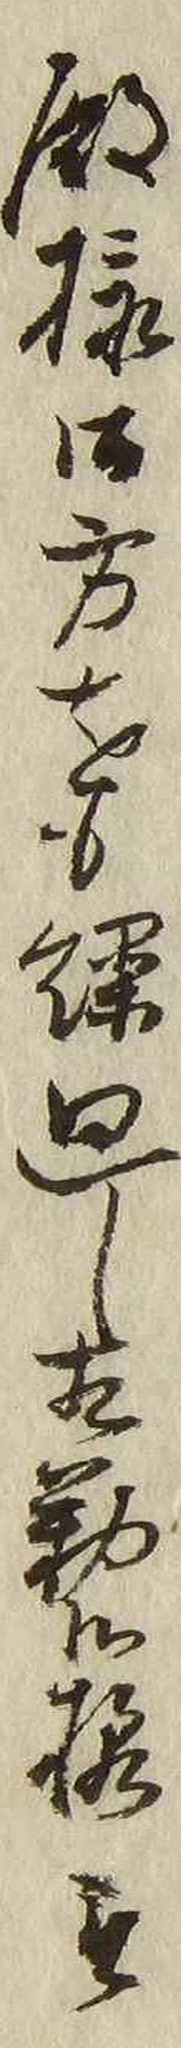殿様御方をも繰廻し相勤候様被

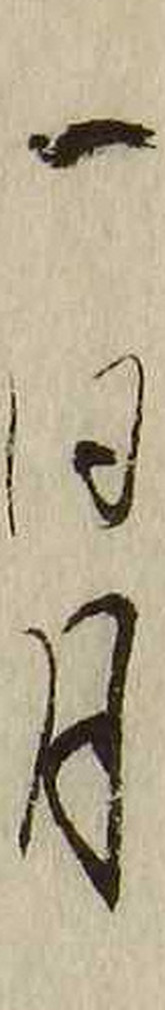一同月
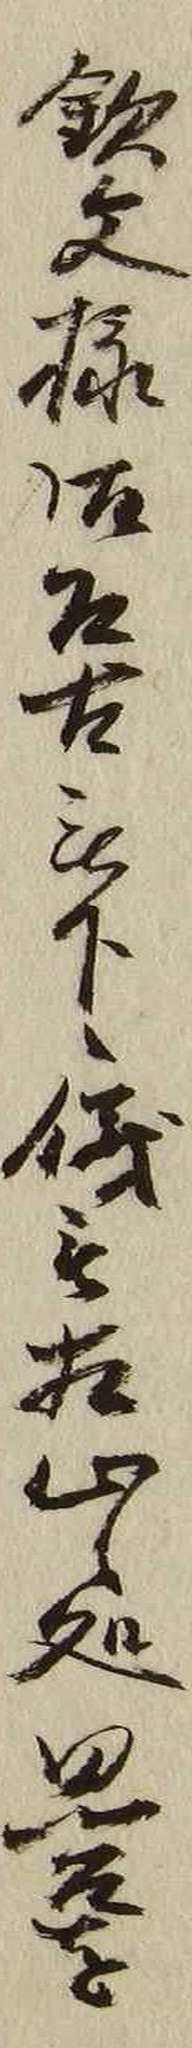欽文様御召古被下候儀被相止候処思召を
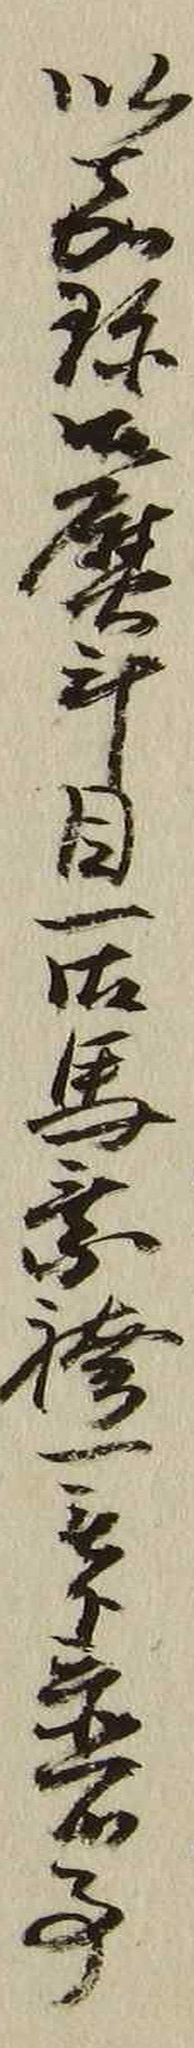以嘉珍御熨斗目一御馬乗袴一被下置候事
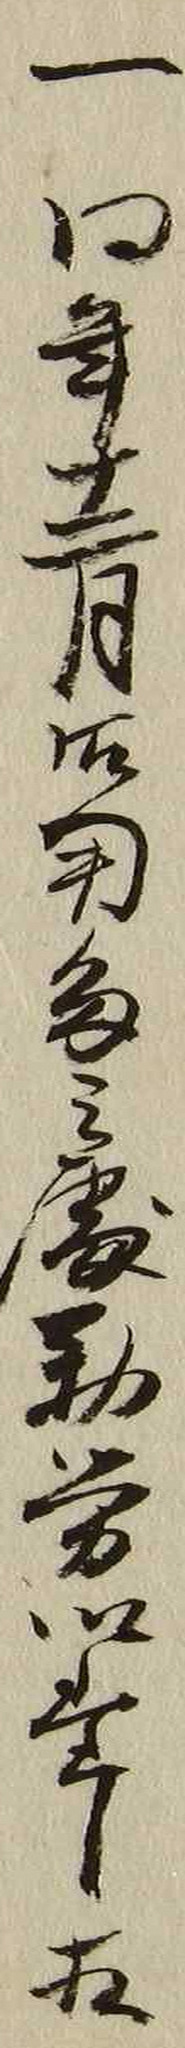一同年十二月御用多之処勤労いたし相
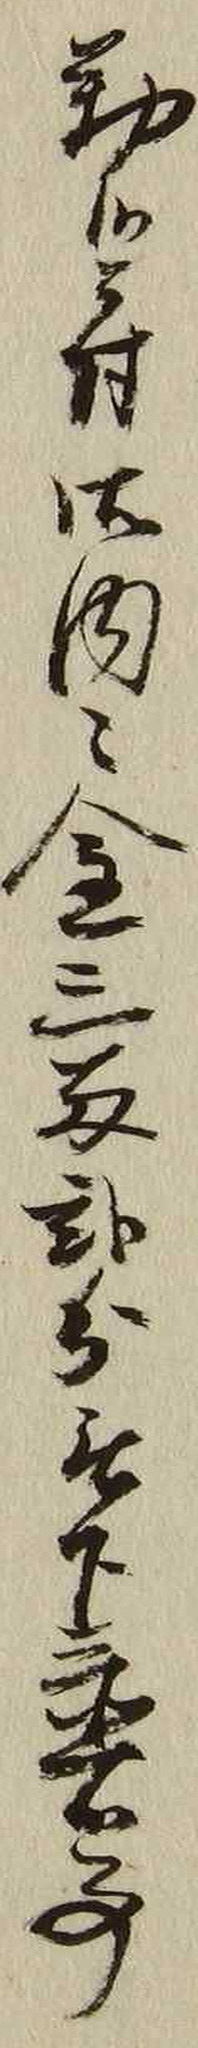勤候ニ付御内々金三両弐分被下置候事
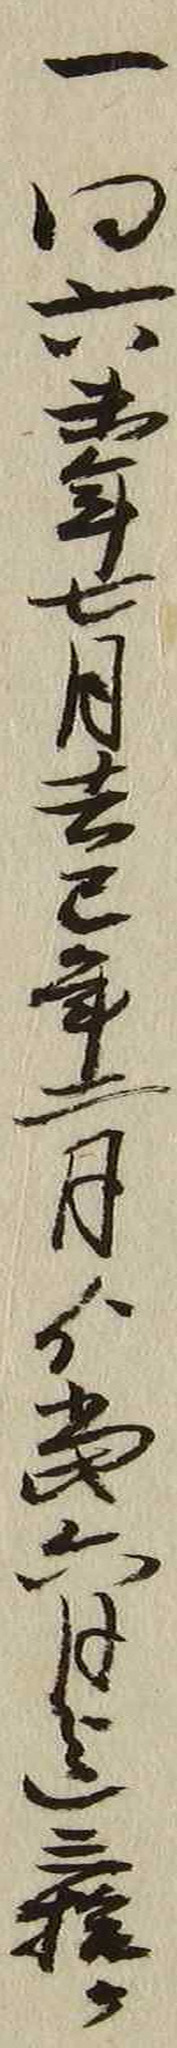一同六未年七月去巳年二月ゟ当六月迄三拾ケ
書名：諸士系譜　巻之345　も之部1
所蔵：会津若松市立会津図書館
